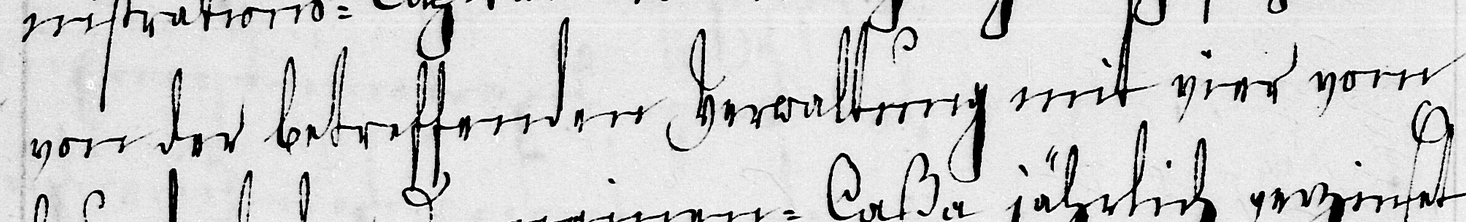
von der betreffenden Verwaltung mit vier vom
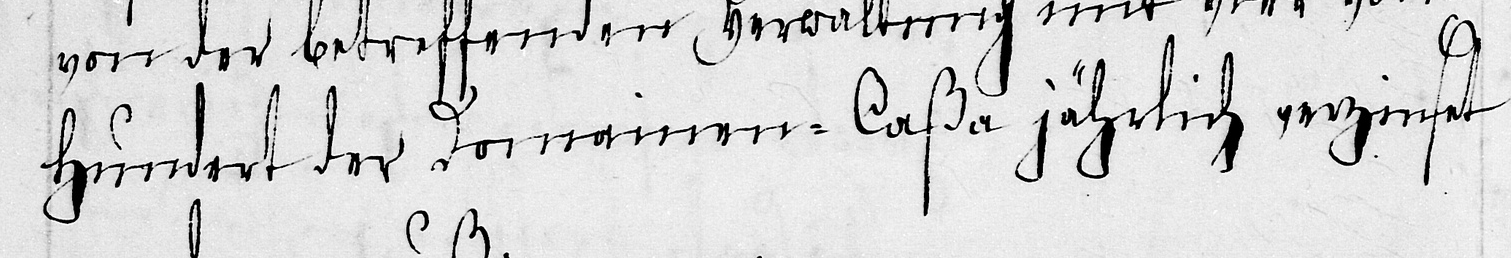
Hundert der Domainen-Caßa jährlich verzinset
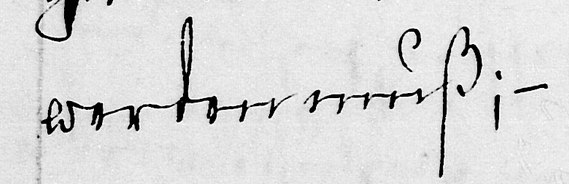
werden muß; –
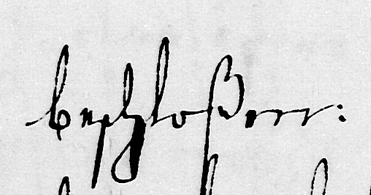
beschloßen:
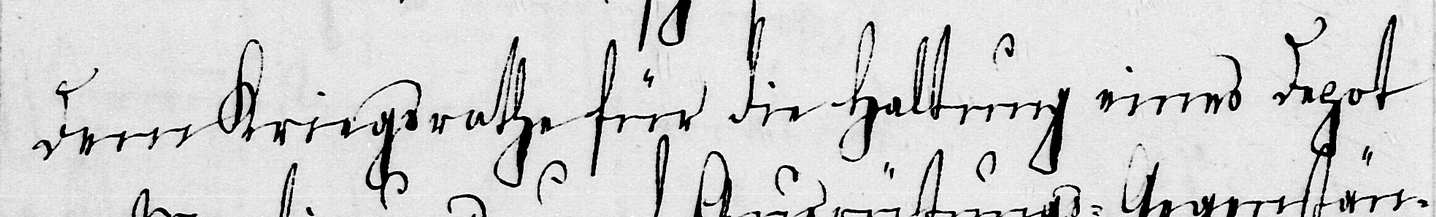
Dem Kriegsrathe für die Haltung eines Depot
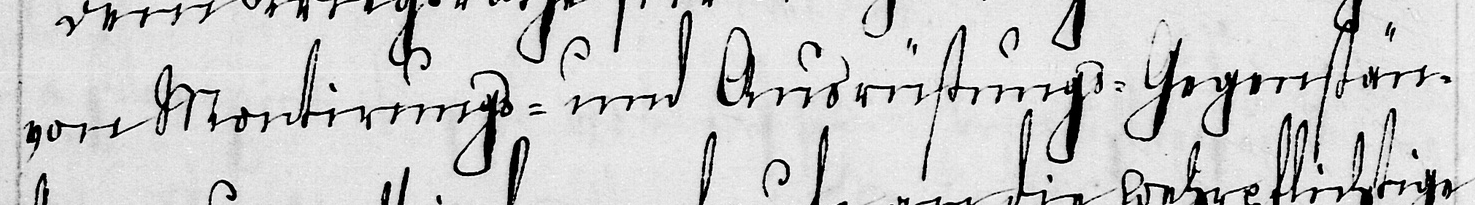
von Montirungs- und Ausrüstungs-Gegenstän¬
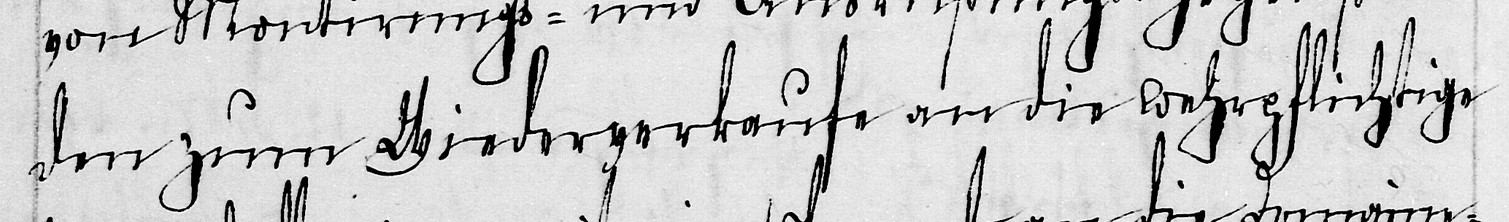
den zum Wiederverkaufe an die wehrpflichtige
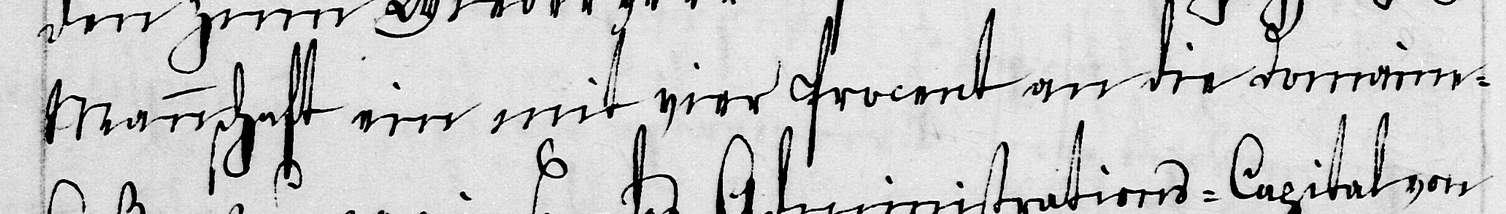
Mannschaft ein mit vier Procent an die Domain¬
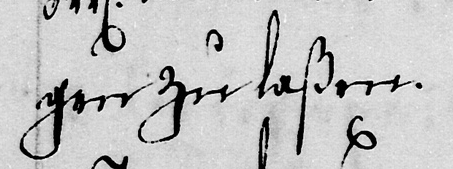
gen zu laßen.
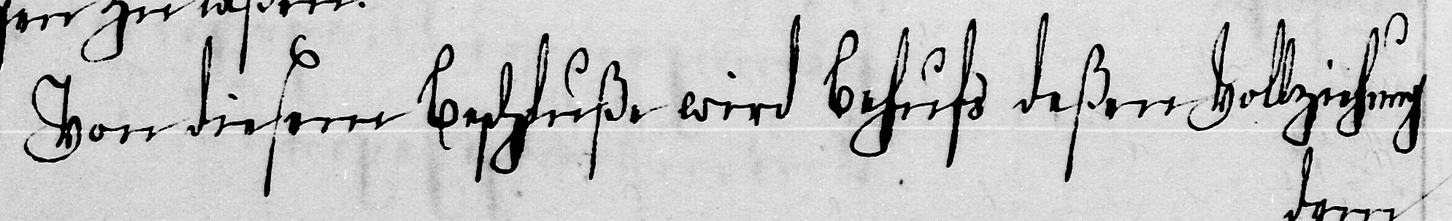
Von diesem Beschluße wird Behufs deßen Vollziehu¬
